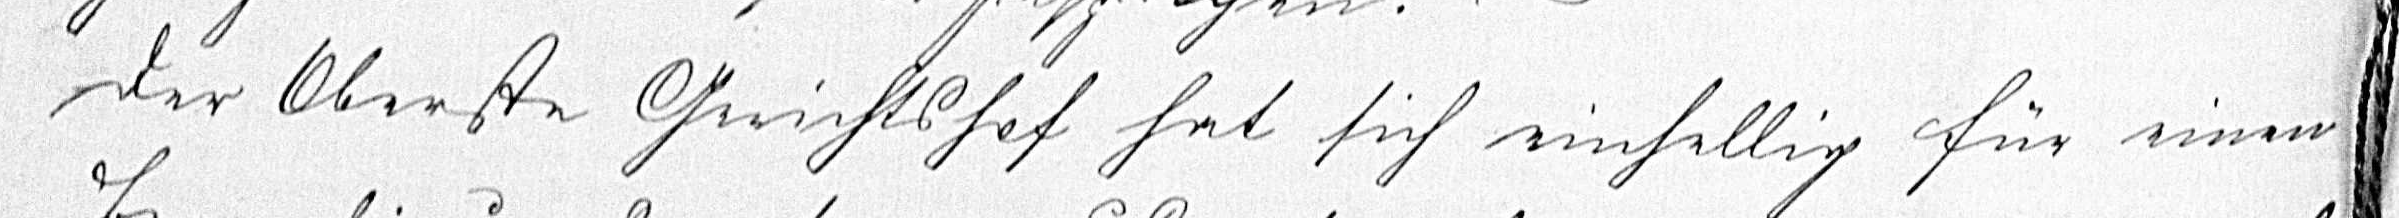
Der Oberste Gerichtshof hat sich einhellig für einen
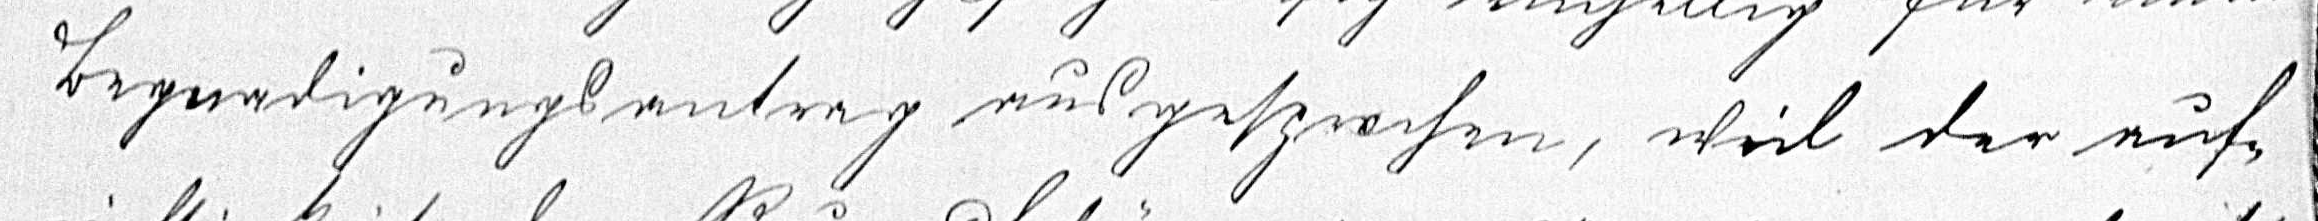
Begnadigungsantrag ausgesprochen, weil der Auf¬
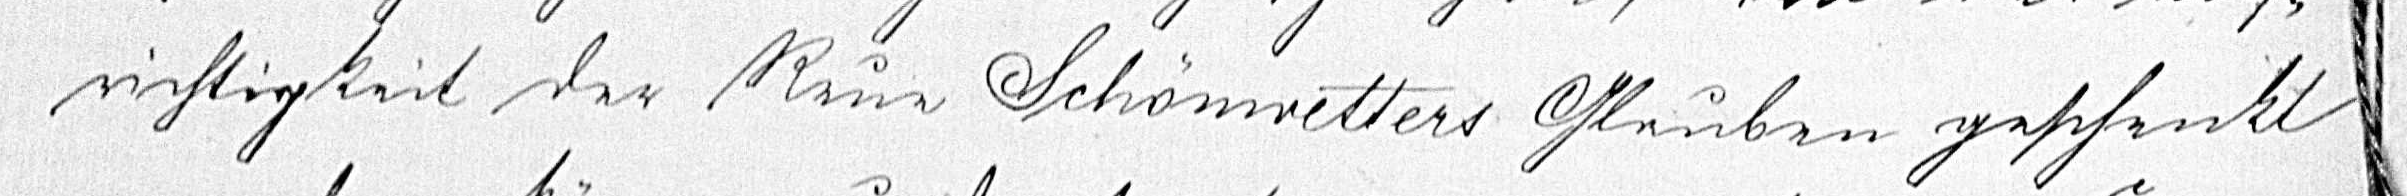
richtigkeit der Reue Schönwetters Glauben geschenkt
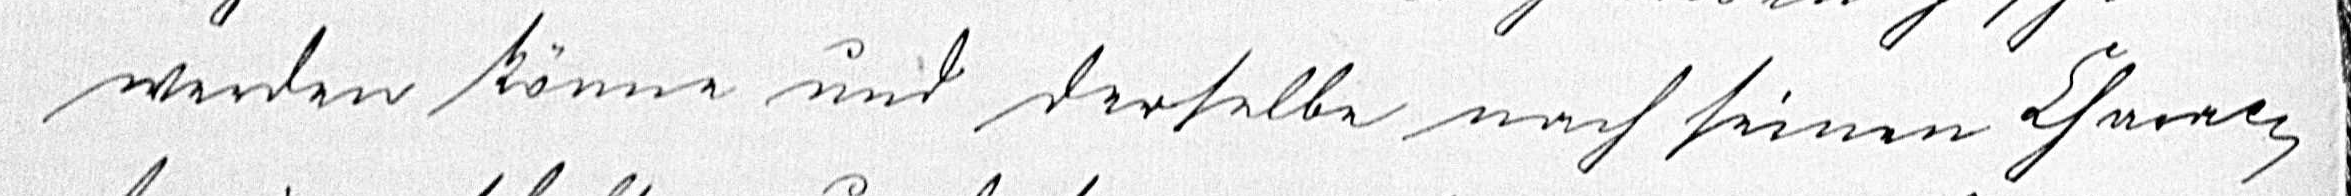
werden könne und derselbe nach seinen Charac¬
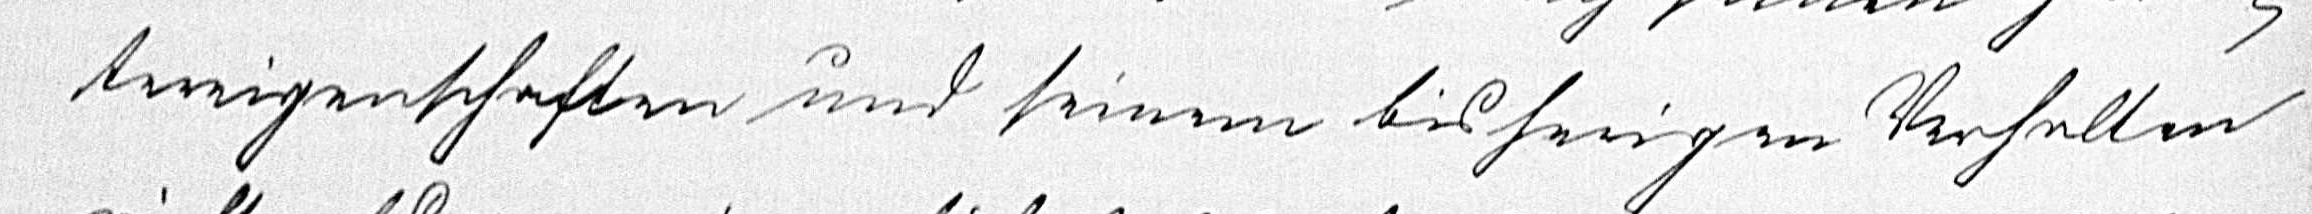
tereigenschaften und seinem bishierigen Verhalten
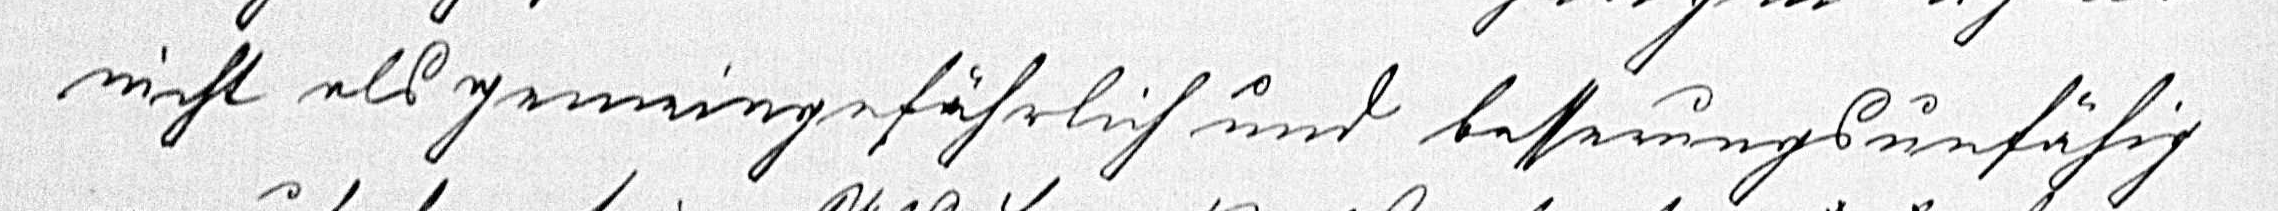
nicht als gemeingefährlich und besserungsunfähig
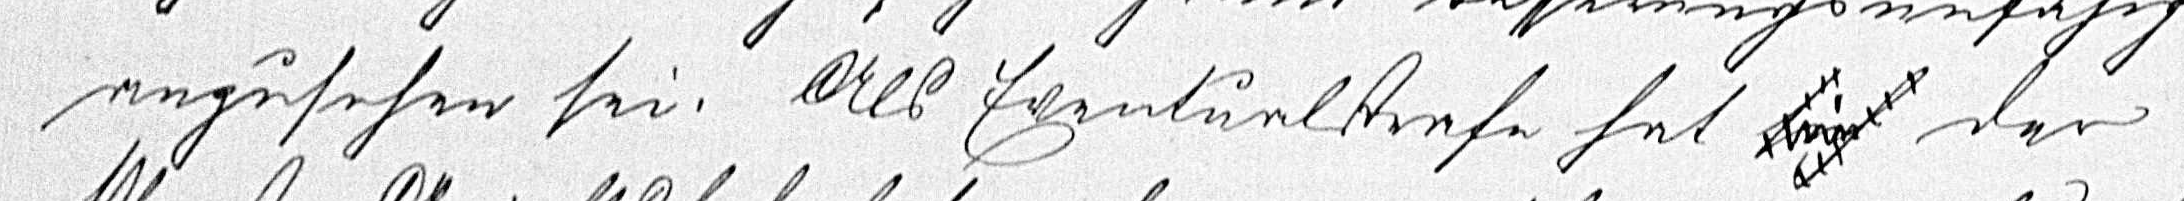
anzusehen sei. Als Eventualstrafe hat der
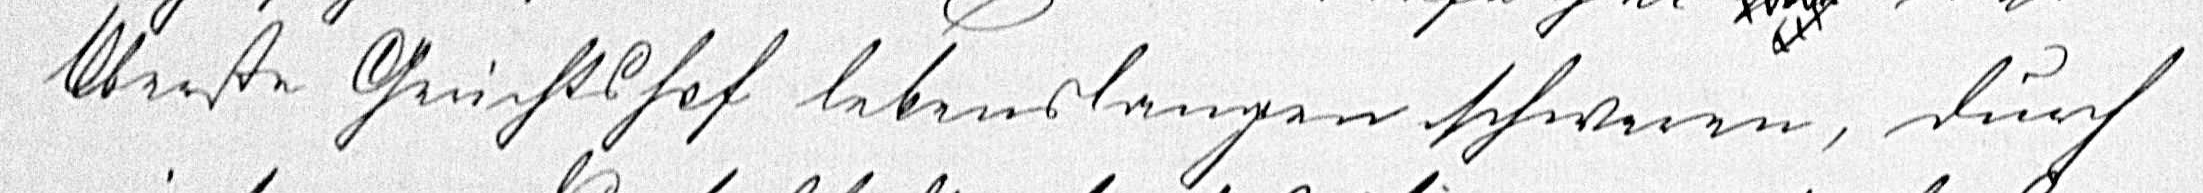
Oberste Gerichtshof lebenslangen schweren, durch
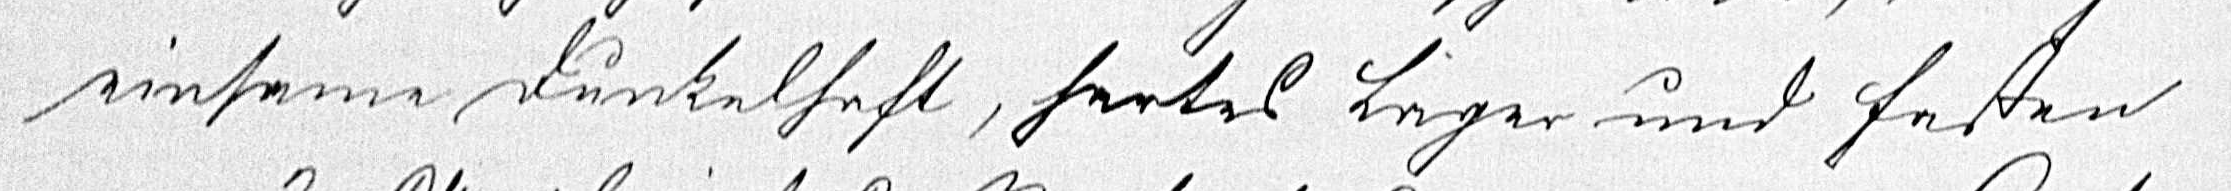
einsame Dunkelhaft, hartes Lager und Fasten
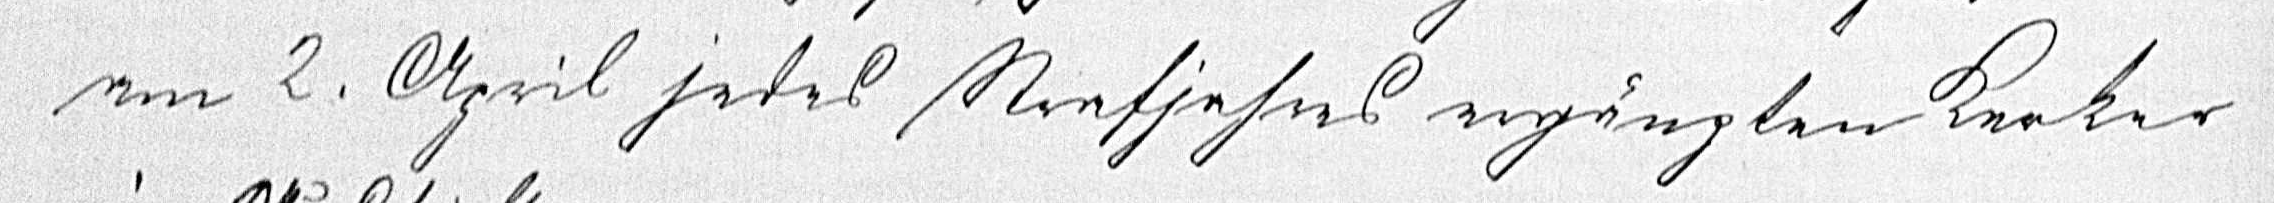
am 2. April jedes Strafjahres ergänzten Kerker
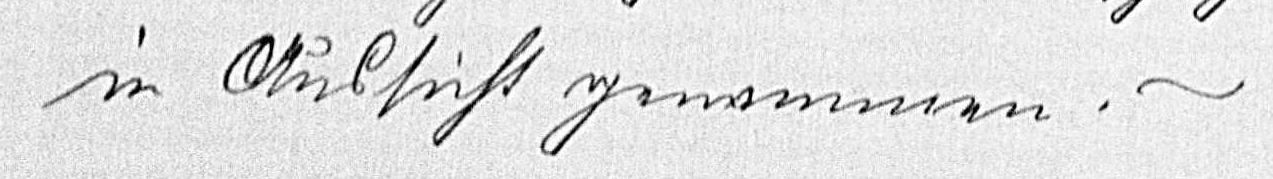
in Aussicht genommen.
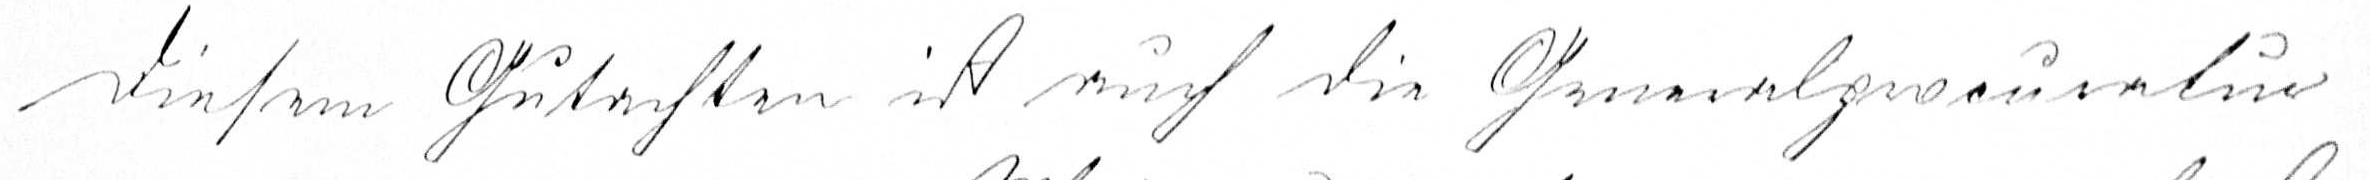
Diesem Gutachten ist auch die Generalprocuratur
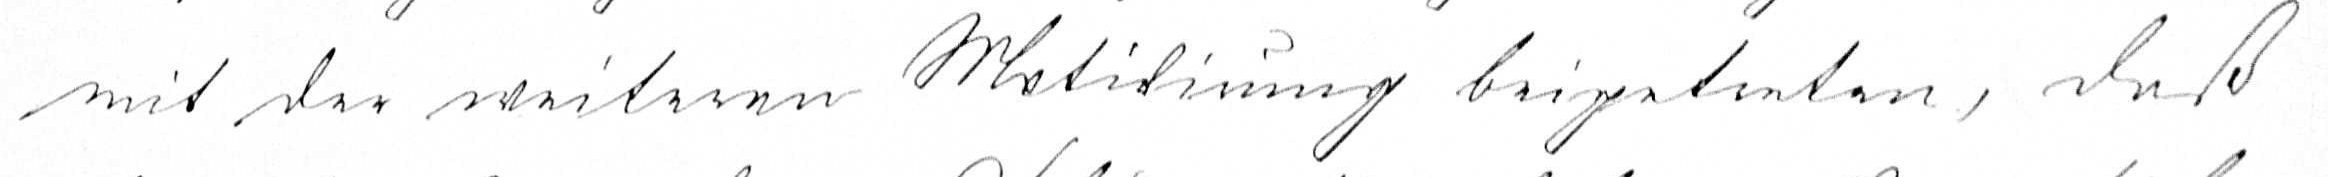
mit der weiteren Motivirung beigetreten, daß
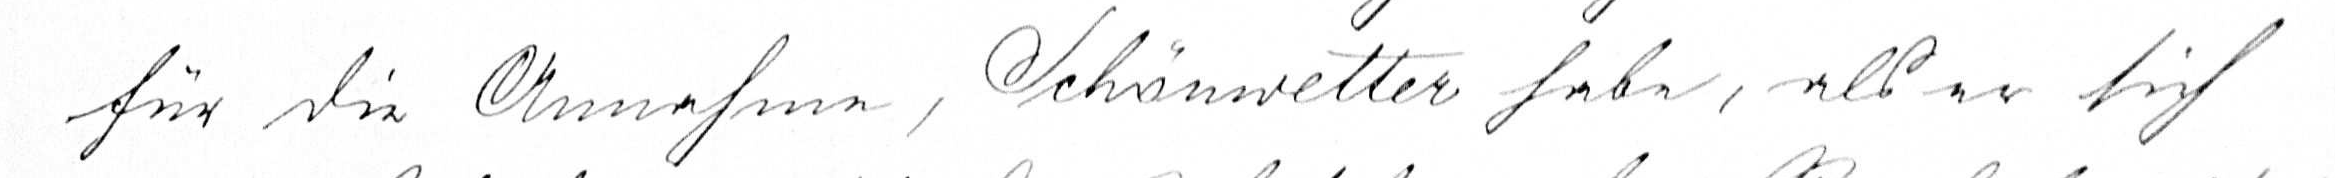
für die Annahme, Schönwetter habe, als er sich
